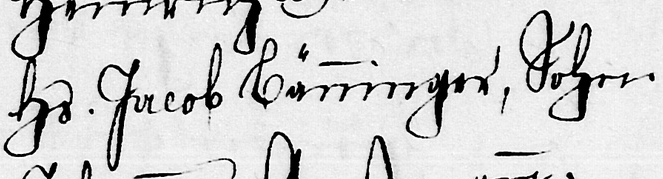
Hs. Jacob Bänninger, Sohn.
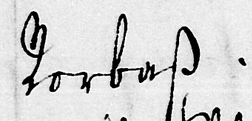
Rorbaß
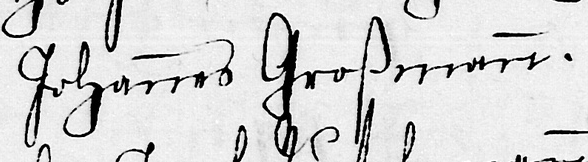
Johannes Großmann.
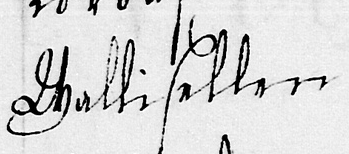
Wallisellen
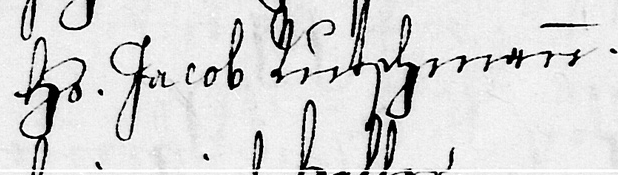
Hs. Jacob Rutschmann.
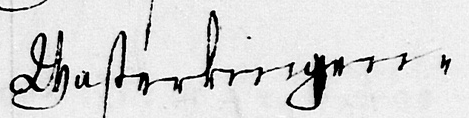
Wasterkingen
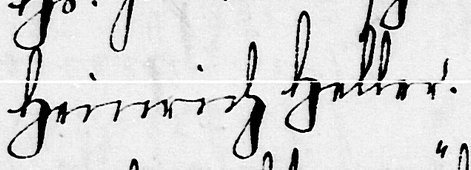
Heinrich Heller.
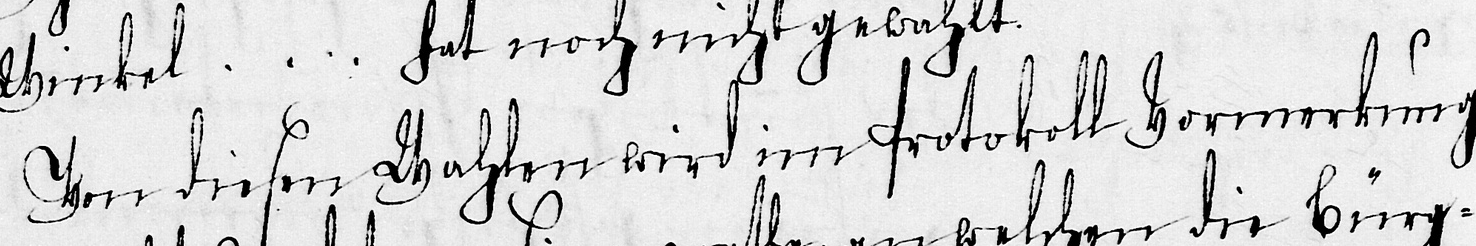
Von diesen Wahlen wird im Protokoll Vormerkung
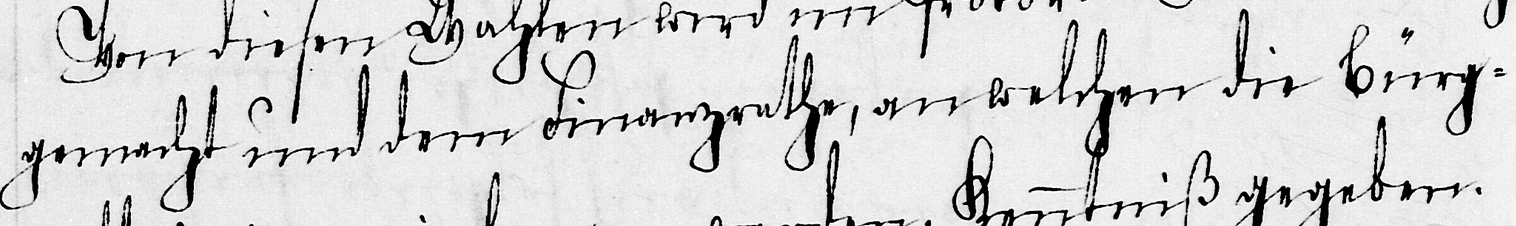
gemacht und dem Finanzrathe, an welchen die Bürg¬
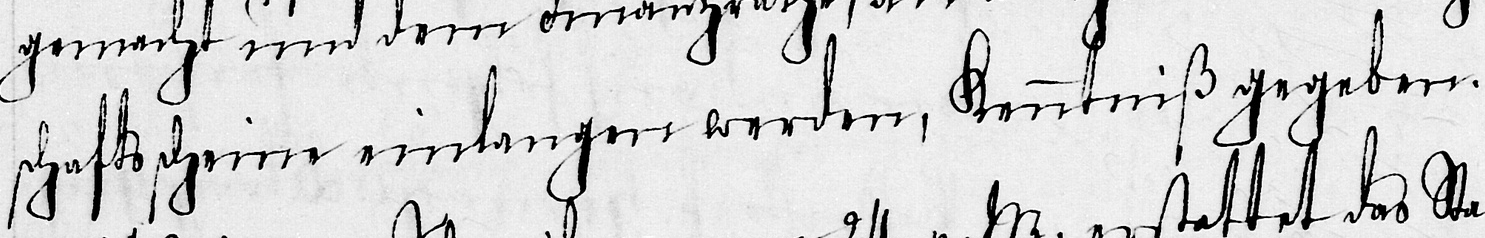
schaftsscheine einlangen werden, Kenntniß gegeben.
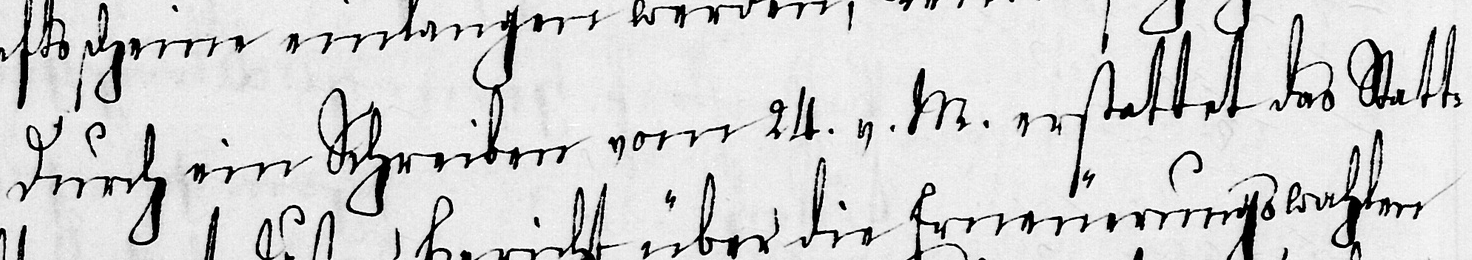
Durch ein Schreiben vom 24. v. M. erstattet das Stat¬
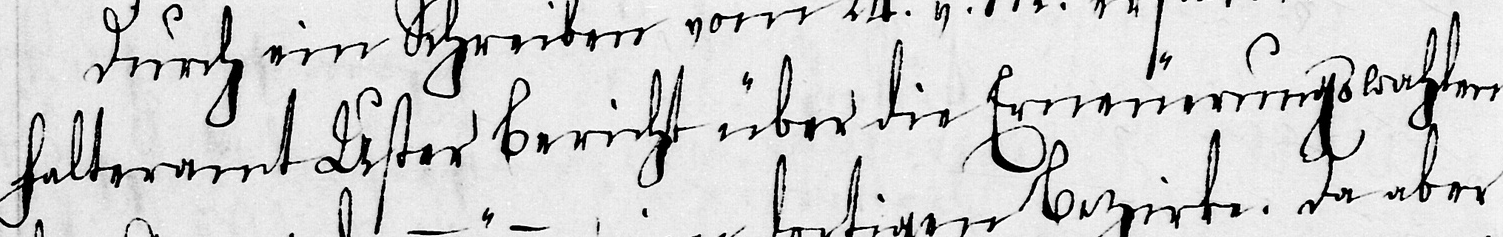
thalteramt Uster Bericht über die Erneuerungswahlen
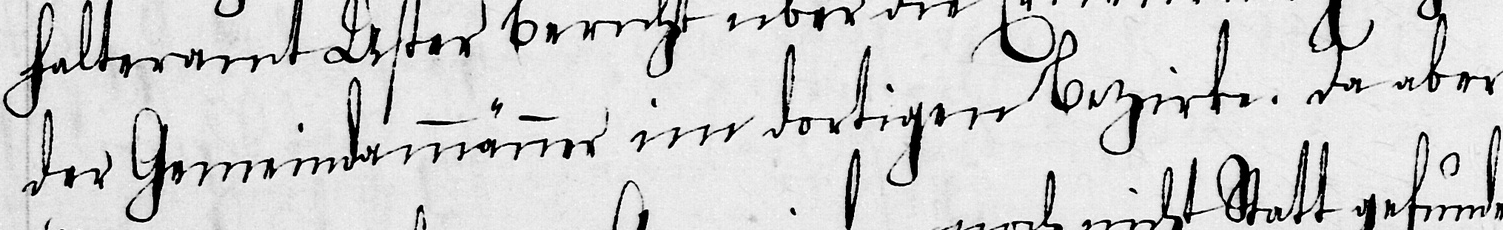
der Gemeindammänner im dortigen Bezirke. Da aber
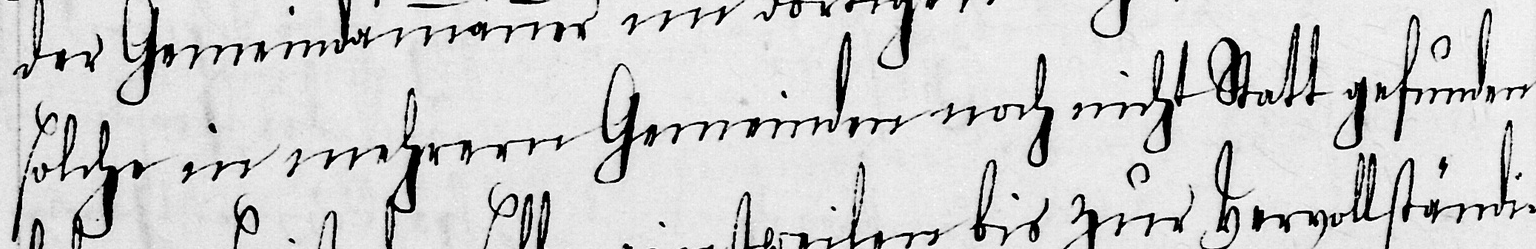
solche in mehrern Gemeinden noch nicht Statt gefunden
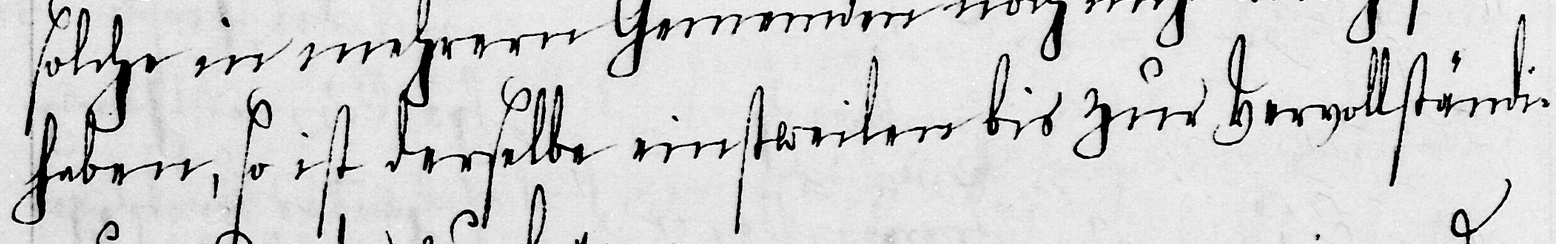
haben, so ist derselbe einstweilen bis zur Vervollständi¬
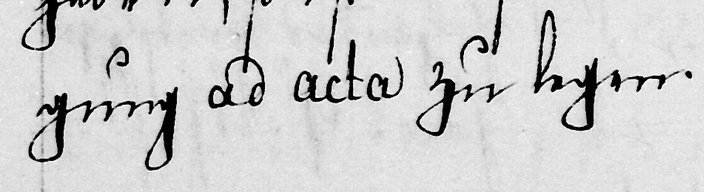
gung ad acta zu legen.
